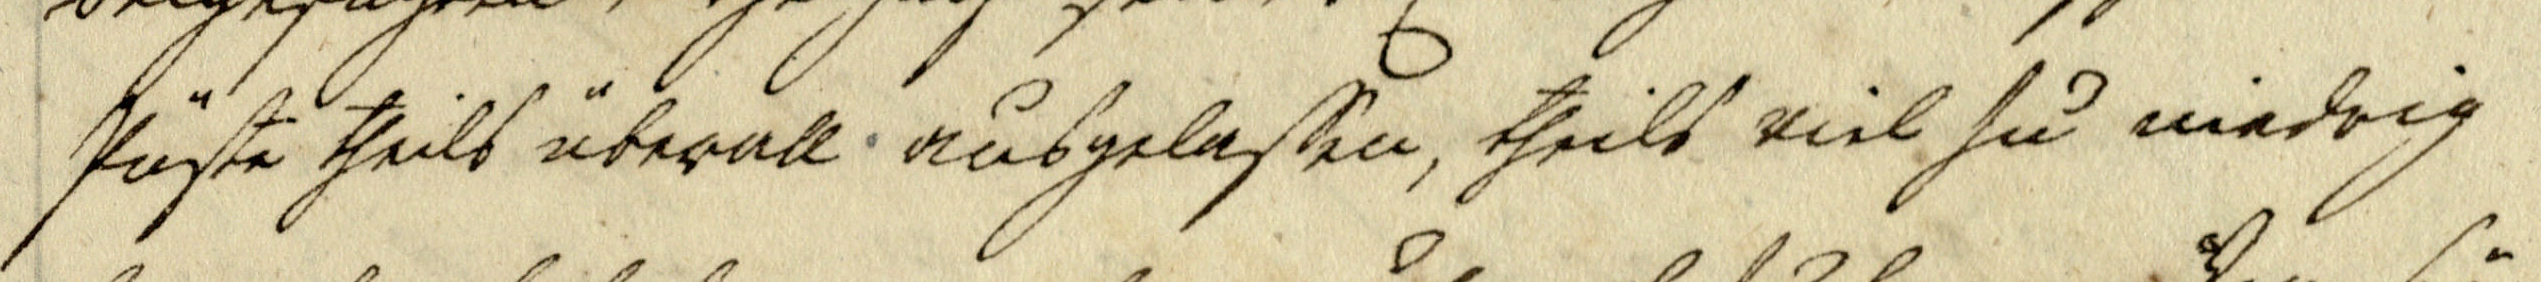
Pöste theils überall ausgelassen, theils viel zu niedrig
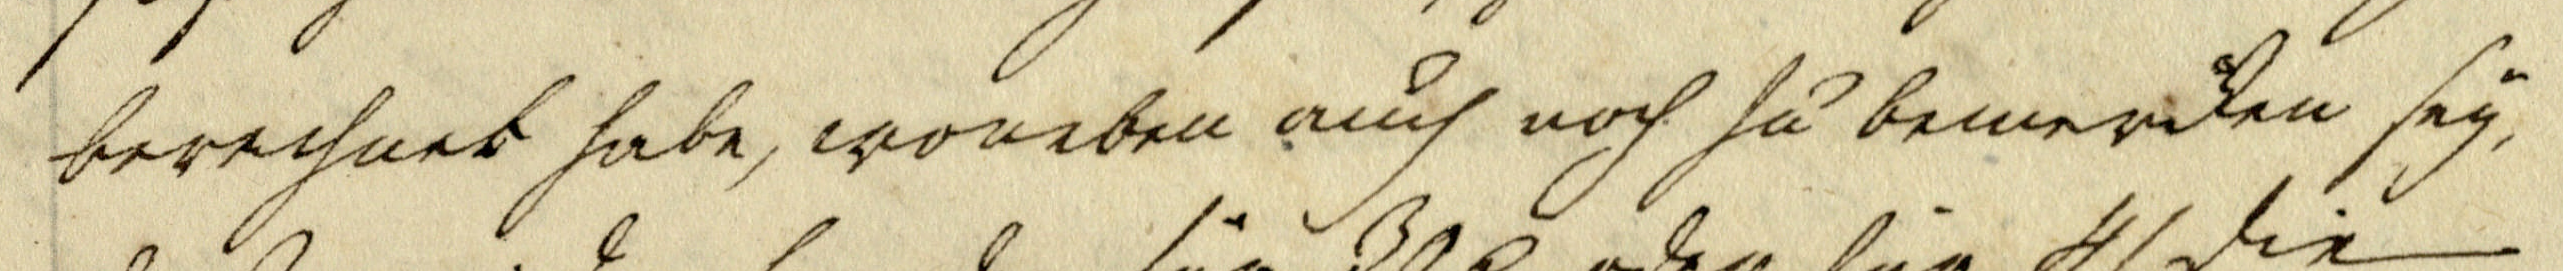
berechnet habe, woneben auch noch zu bemercken seÿ,
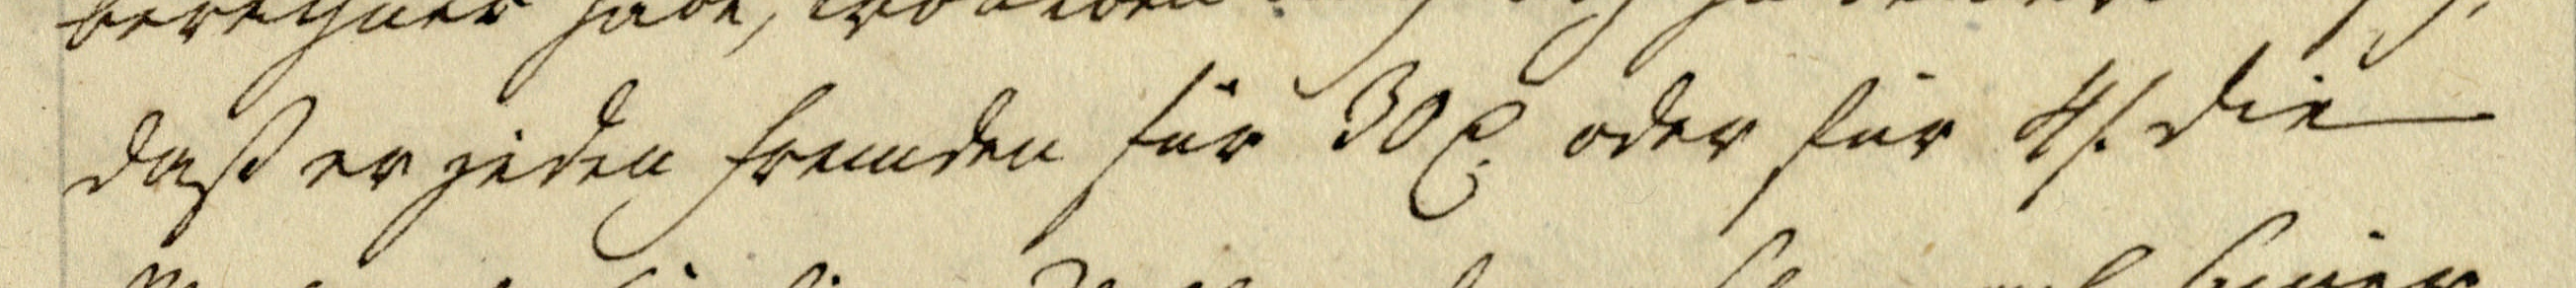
daß er jeden Fremden für 30 l. oder für 4 s. die
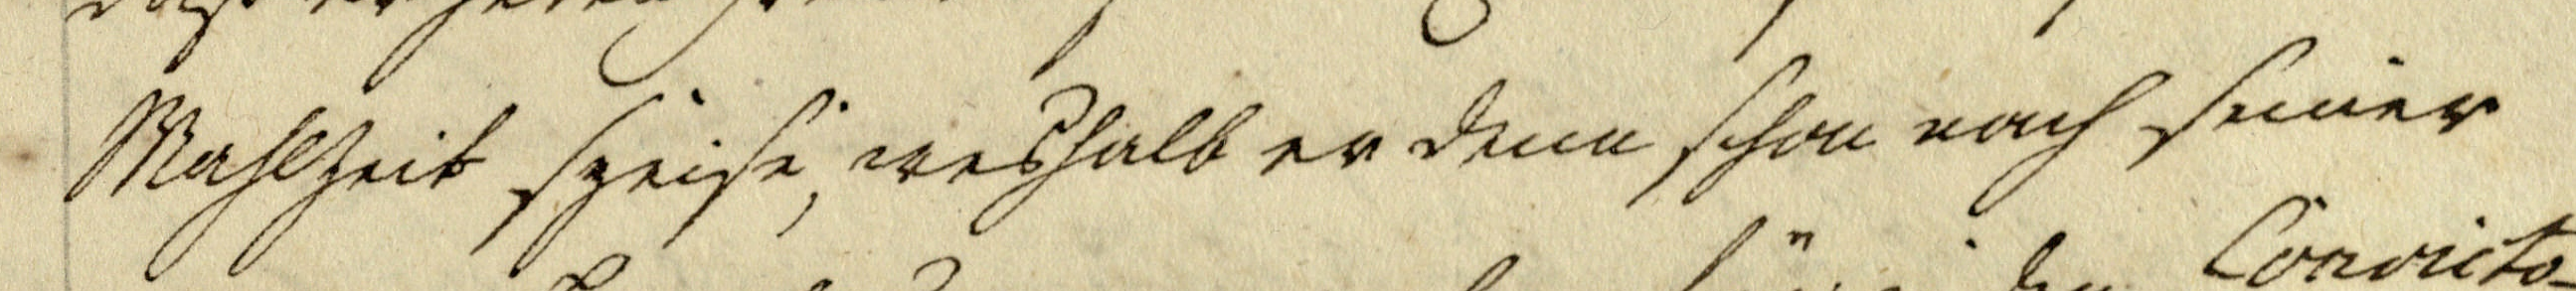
Mahlzeit speise, weshalb er denn schon nach seiner
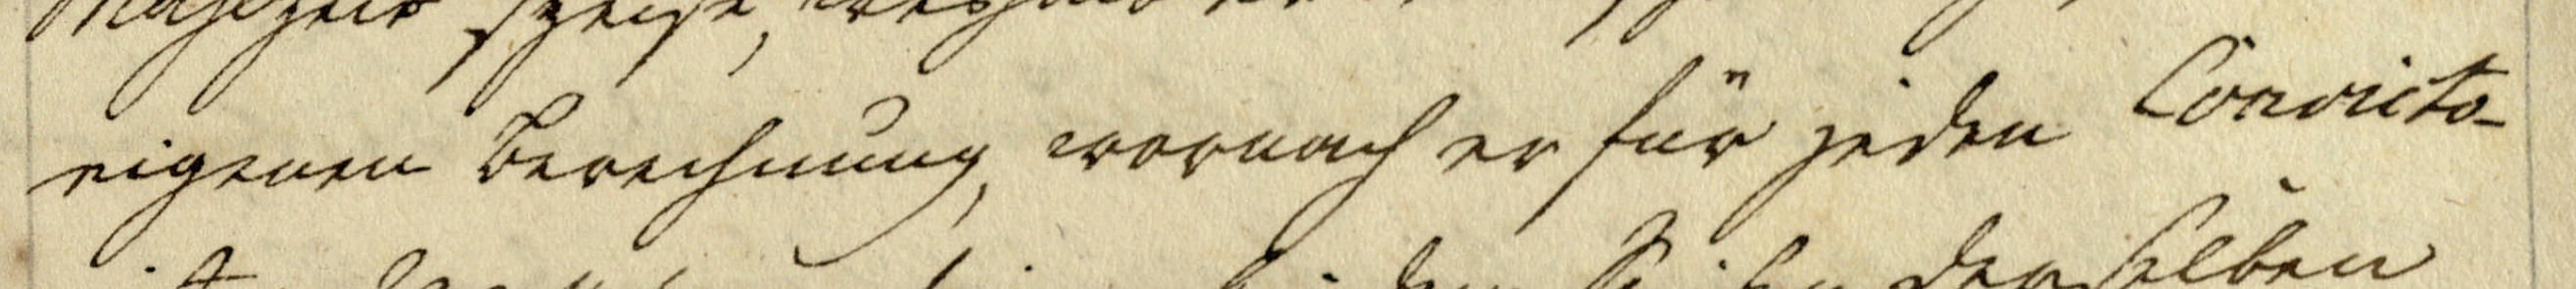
eigenen Berechnung, wornach er für jeden Convicto¬
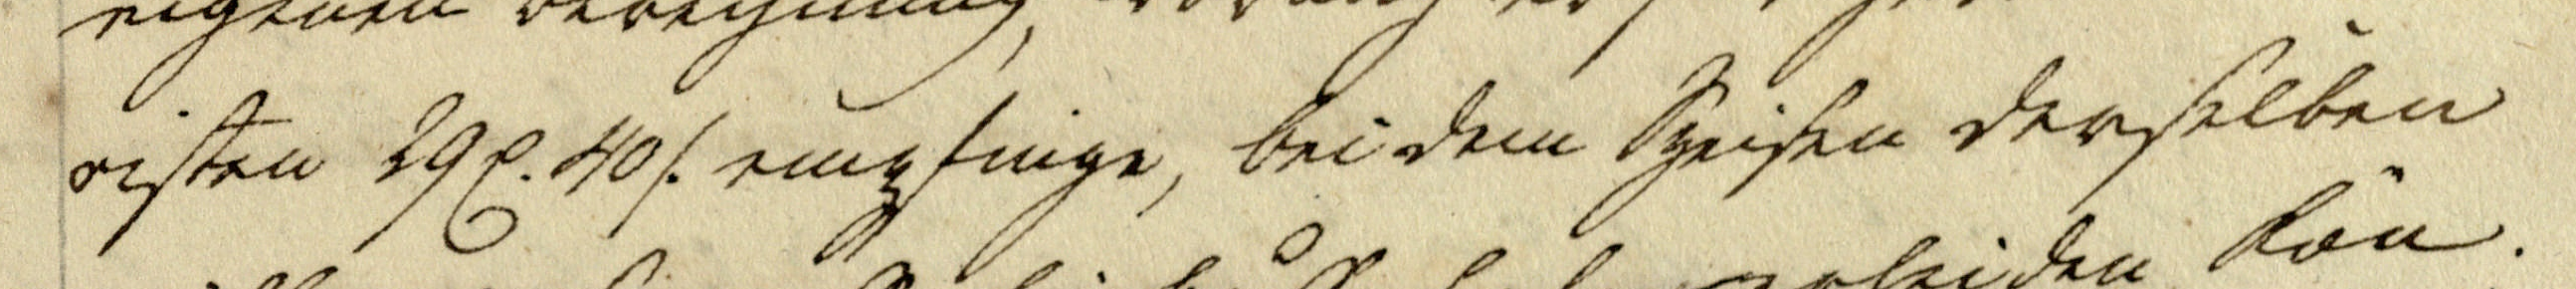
risten 29 l. 40 s. empfinge, bei dem Speisen derselben
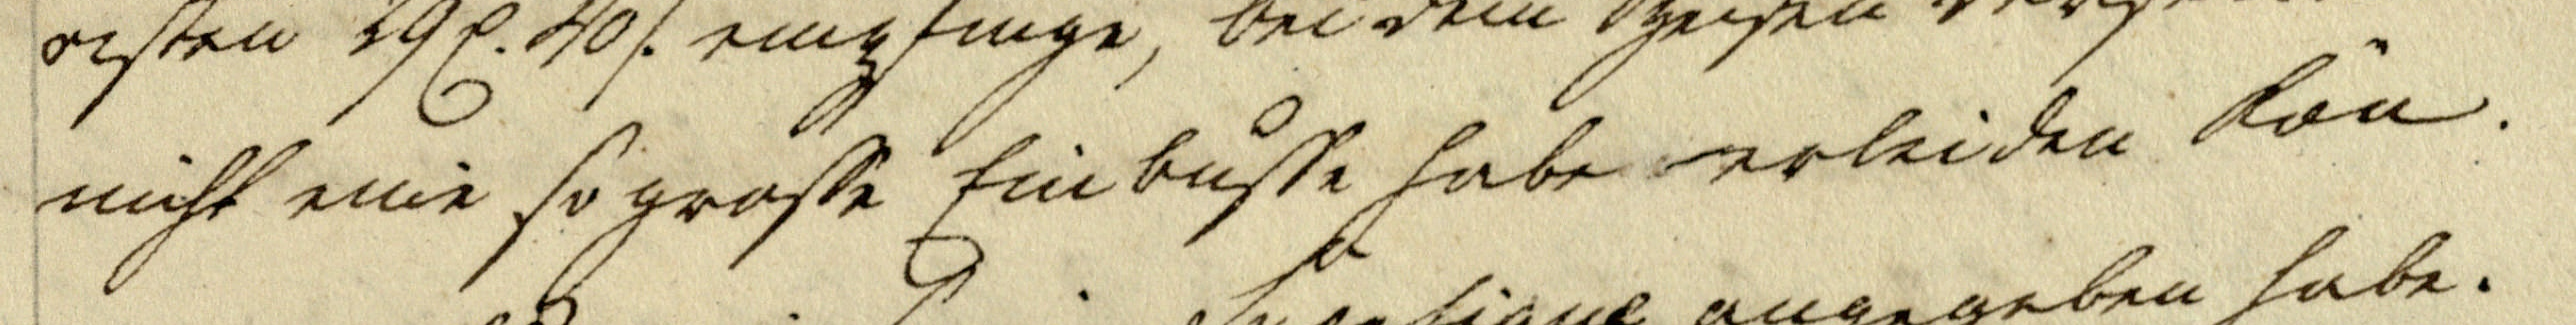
nicht eine so grosse Einbusse habe erleiden kön¬
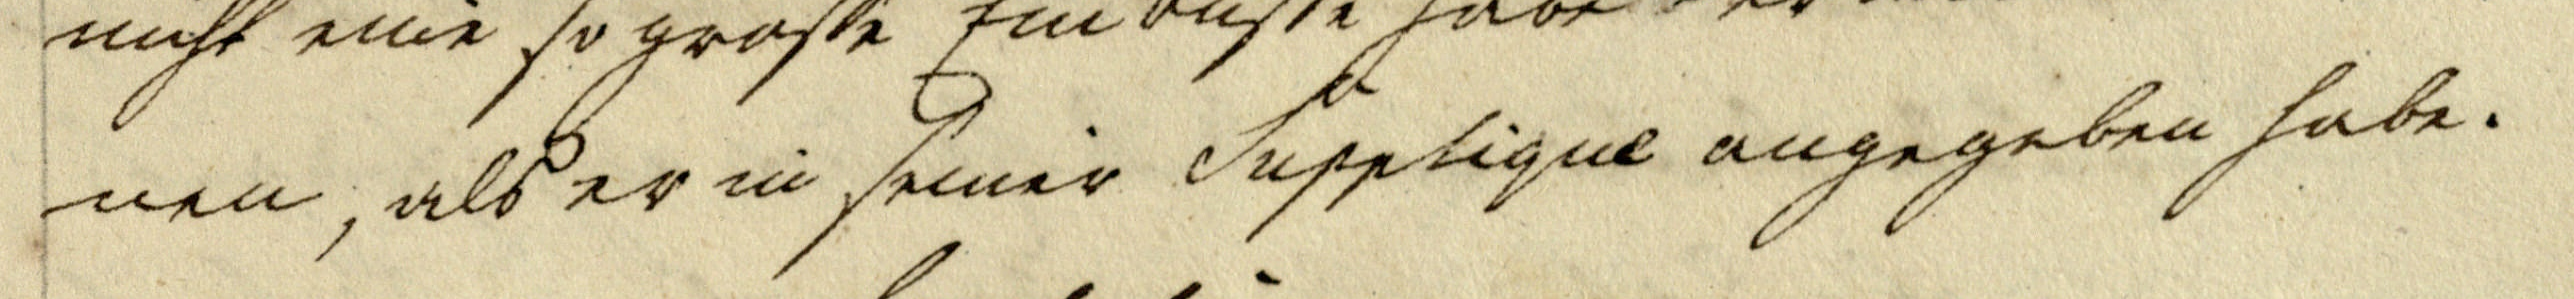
nen, als er in seiner Supplique angegeben habe.
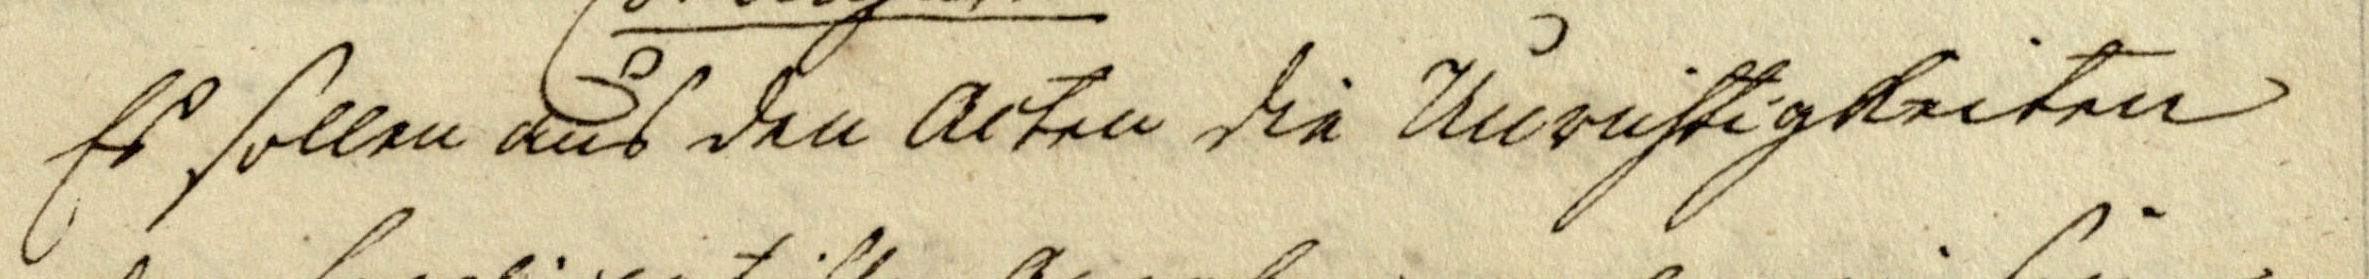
Es sollen aus den Acten die Unrichtigkeiten
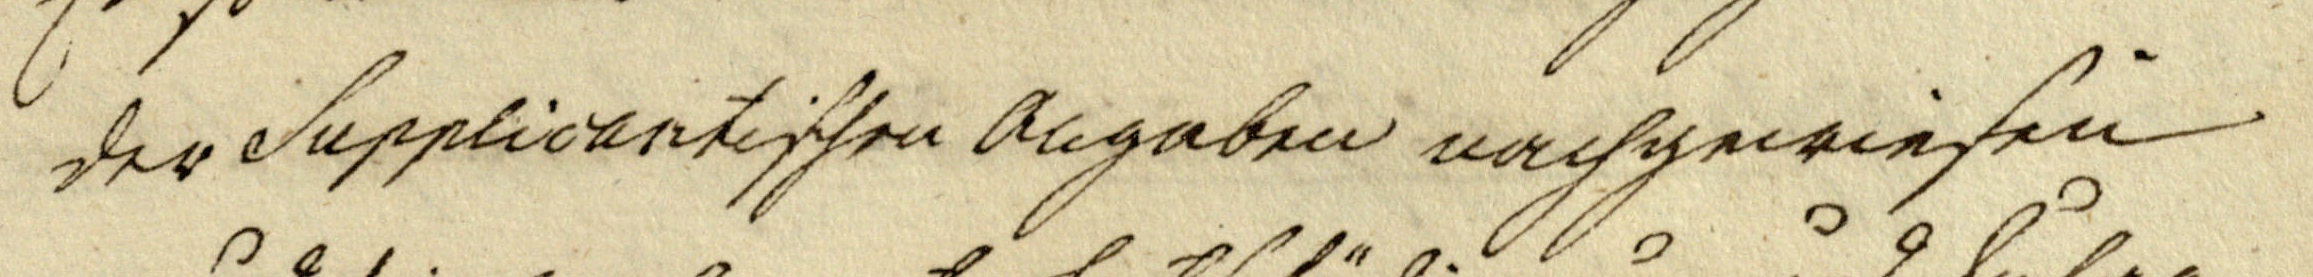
der Supplicantischen Angaben nachgewiesen
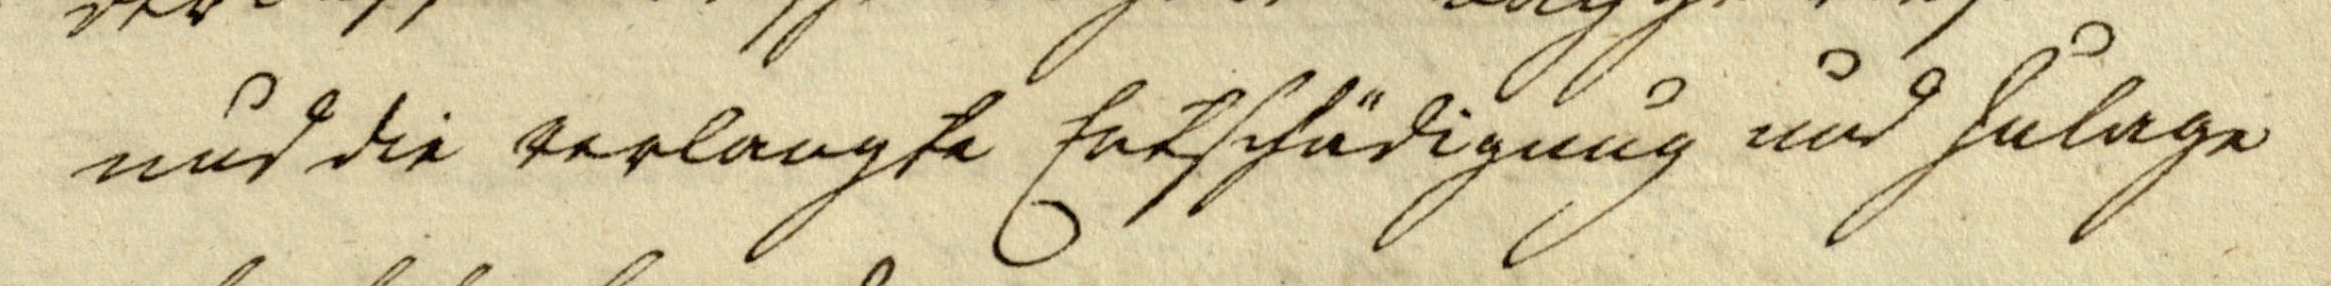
und die verlangte Entschädigung und Zulage
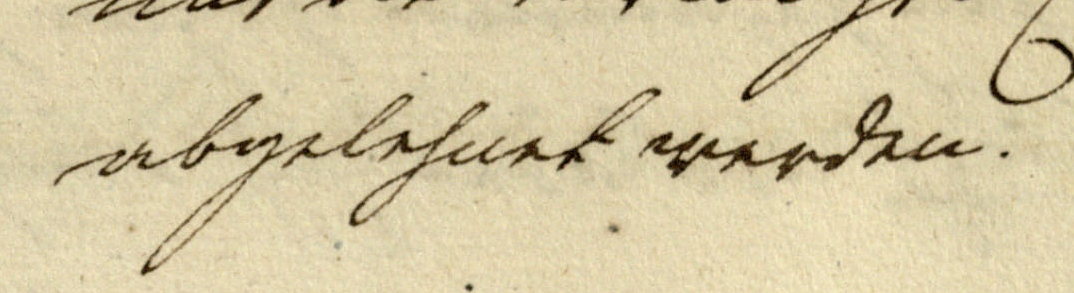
abgelehnet werden.
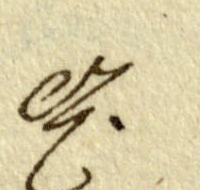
dh.
